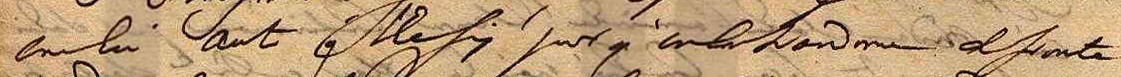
em hū auto q̄ lhe fis porq̄ enControume defronte
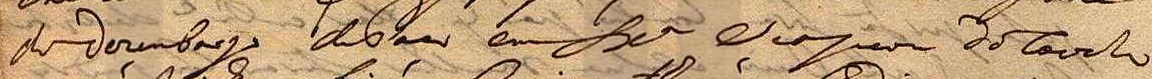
do dezenbargo do Paço em Lxa Se apeou do Cavalo
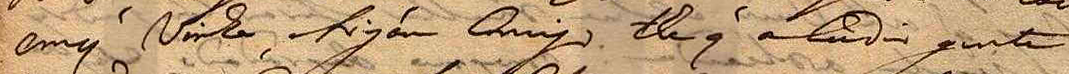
em q̄ Vinha, e brigou Comigo the q̄ aCudio gente
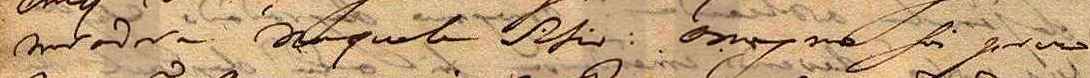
moradora naquele sitio: o mesmo foi prezo
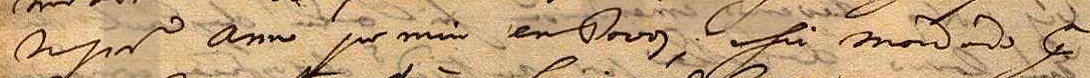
no pro anno por min en Povos, e foi mandado pa
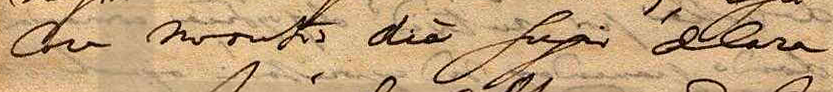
Caza no outro dia fugir de Caza
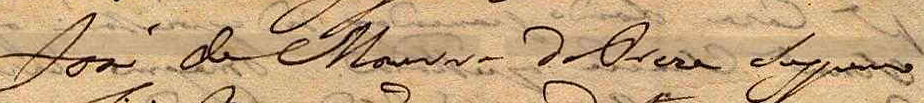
Joaõ de Mourera do Preza Suspenso
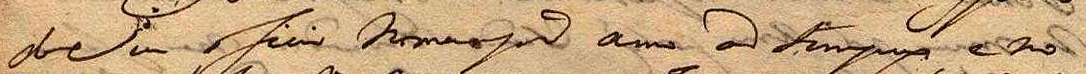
de seu oficio nomeo por amo ao tempo, e no
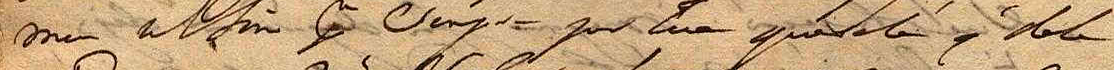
meu ultimo pa sempre= por hua querela q̄ dele
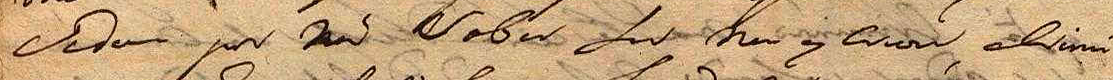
se deue por naõ Saber ler nem escrever, o Crimi
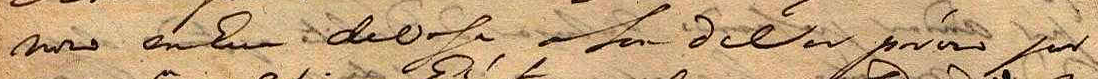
nozo en hua devasa, alen de ser prezo por
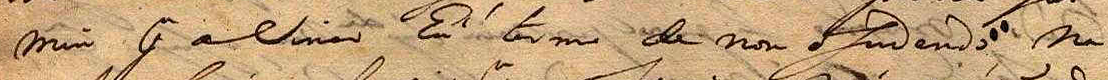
min pa aSinar hū termo de non ofendendo na
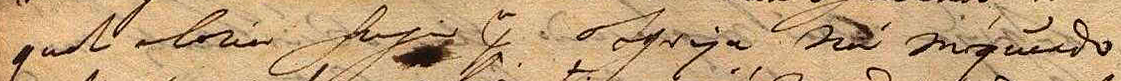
qual alazia[??] fugir pa a Igreja naõ mo quēndo
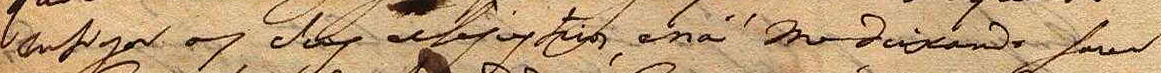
entregar os seus eclesisticos, e naõ me deixando fazer
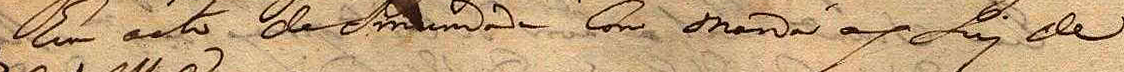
hū acto de Imendada Como manda as leis de
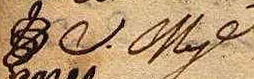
S. Mage
